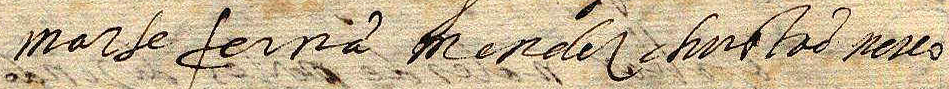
marse fernā mendez christaõ nouo
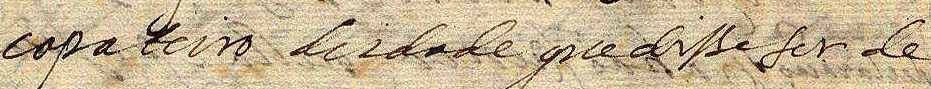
capateiro de idade que disse ser de
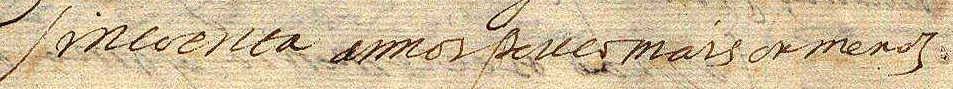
sincoenta annos pouco mais ou menos
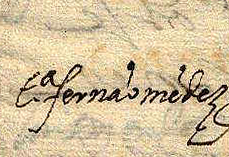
t.a fernaõ mēdez
